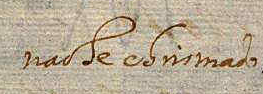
naõ he chrismado
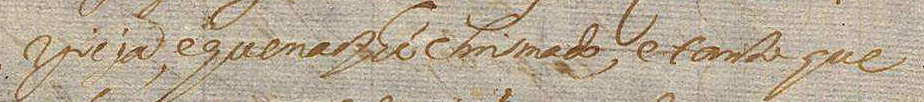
igreja, e que naõ hé chrismado, e tanto que
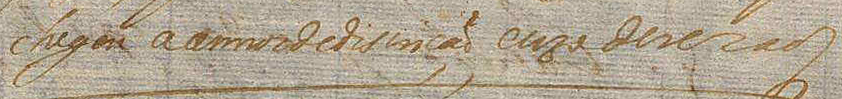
chegou a annos de discriçaõ e uzo de rezaõ
